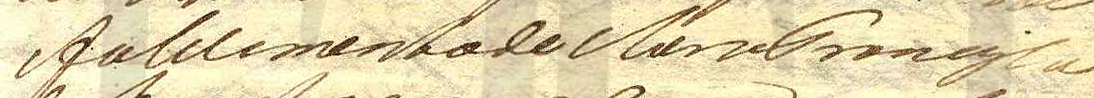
e falecimento de clara Francisca
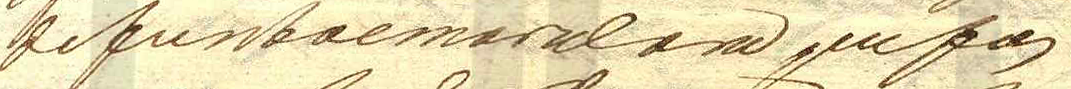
defunta e moradora que foj
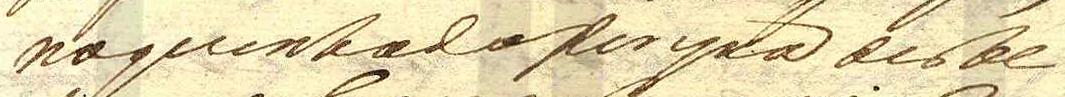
na quinta da pereyra deste
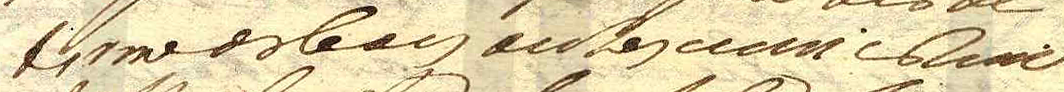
termo os Coaes autos eu ui e Reui
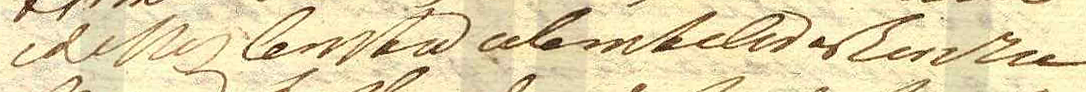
e delles Consta aComteCer a thereZa
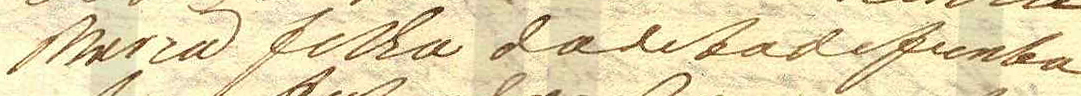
Maria filha da dita defunta
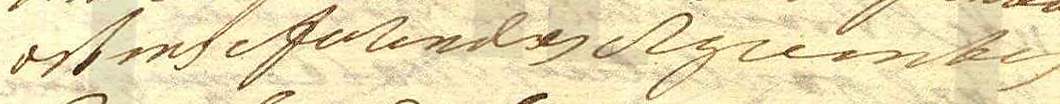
os bens e fazendas seguintes
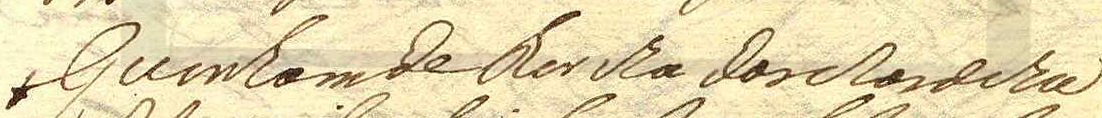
Quinham de thereZa dos seos deZa
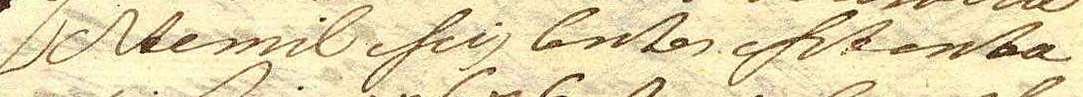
sete mil e seisCentos e setenta
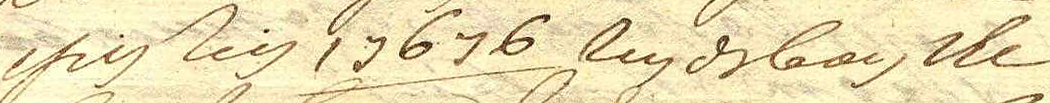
e seis Reis 17676 Reis os Coais lhe
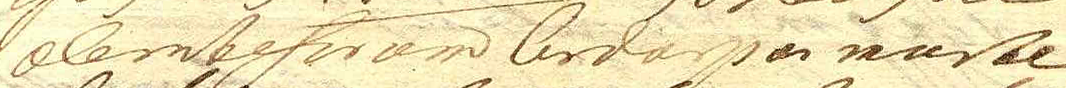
aComteseram herdar por morte
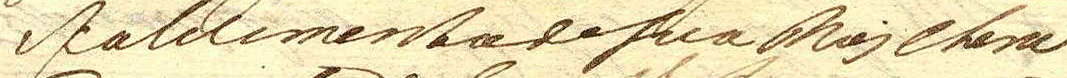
e falecimento de sua Maj Clara
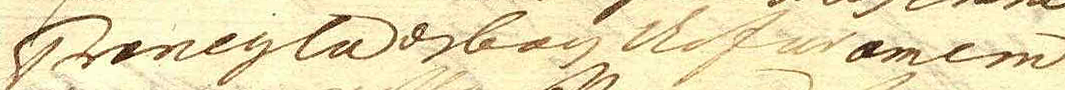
FrancisCa os Coais lhe foram em
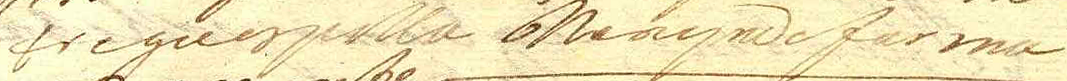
tregues pella Manejra e forma
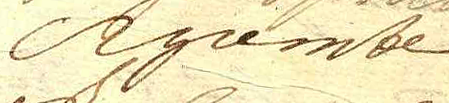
seguinte
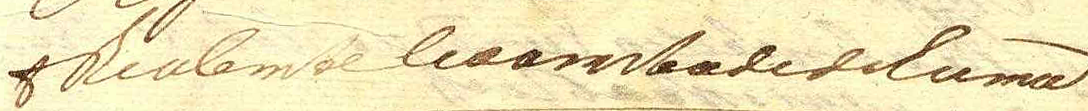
item lhe aComteCeo a ametade de huma
